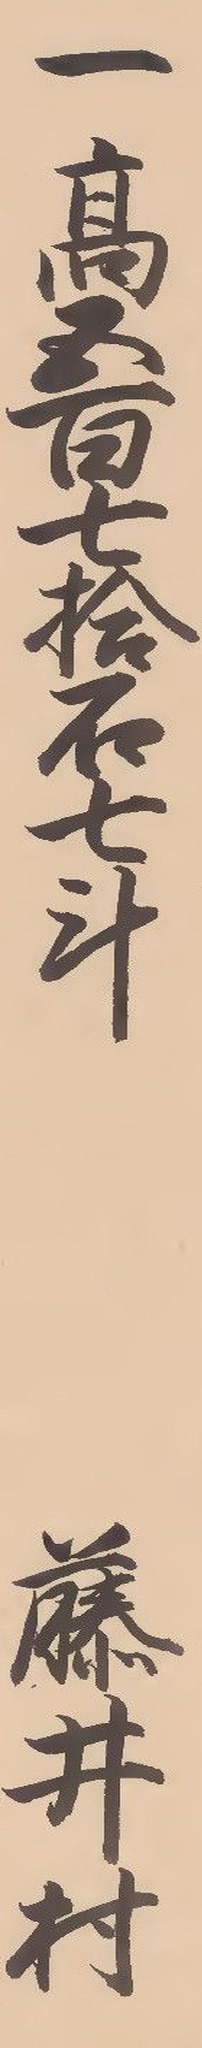一髙五百七拾石七斗藤井村
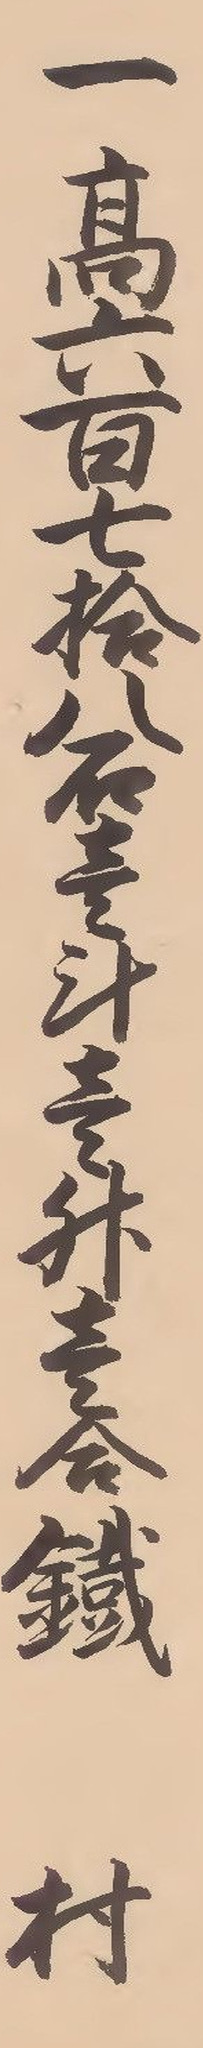一髙六百七拾八石壱斗壱升壱合鐵村
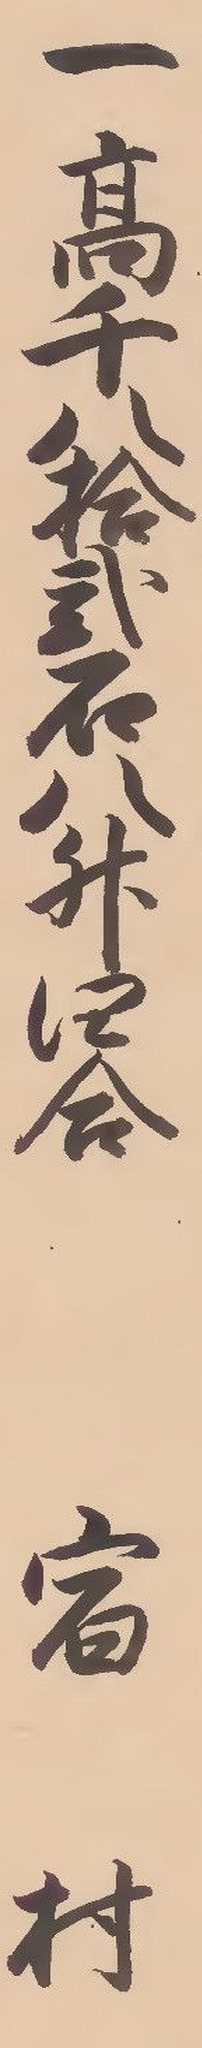一髙千八拾弐石八升四合宿村
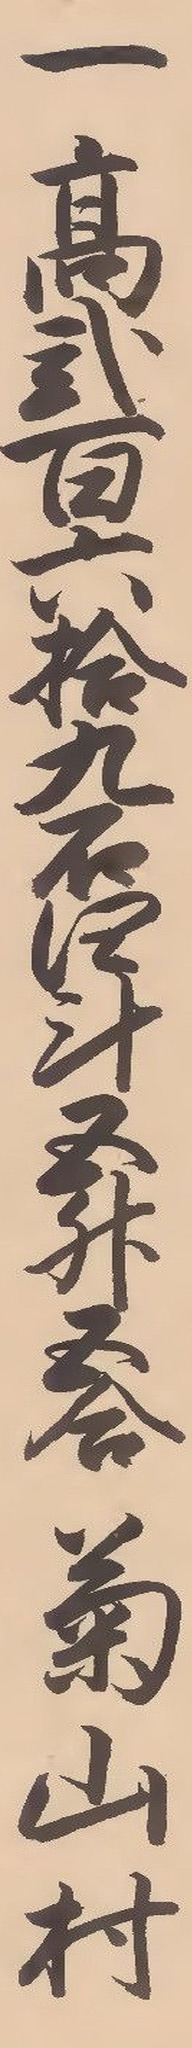一髙弐百六拾九石四斗五升五合菊山村
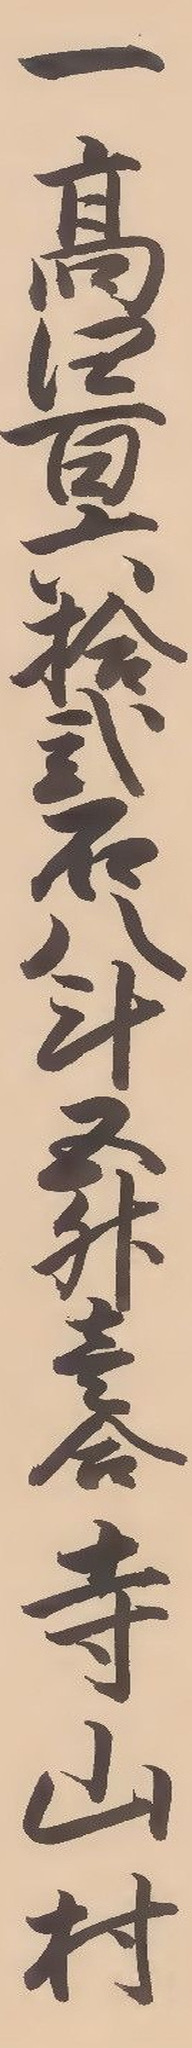一髙四百六拾弐石八斗五升壱合寺山村
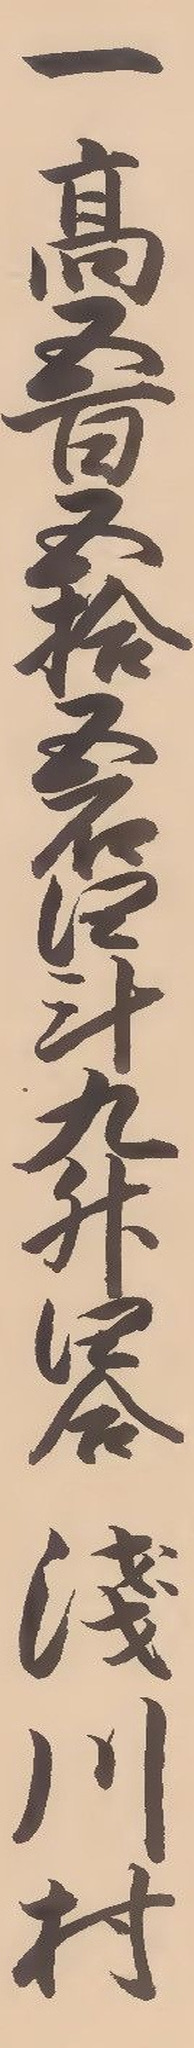一髙五百五拾五石四斗九升四合浅川村
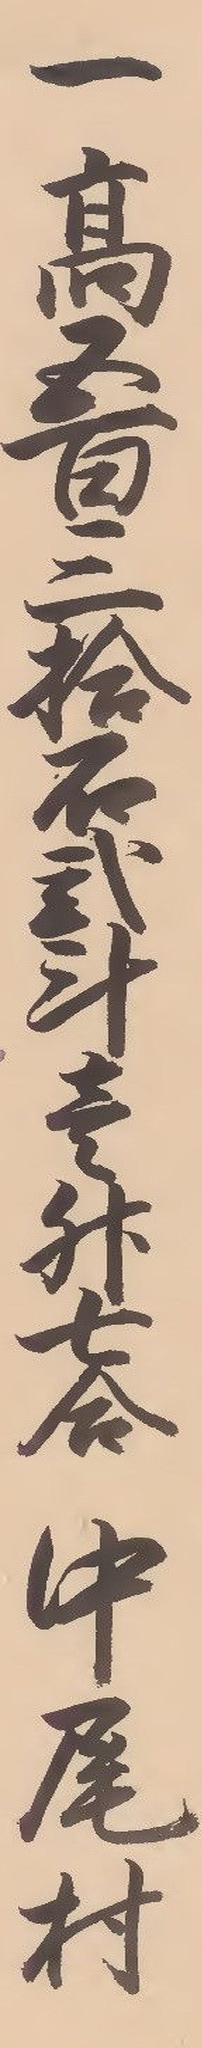一髙五百三拾石弐斗壱升七合中尾村

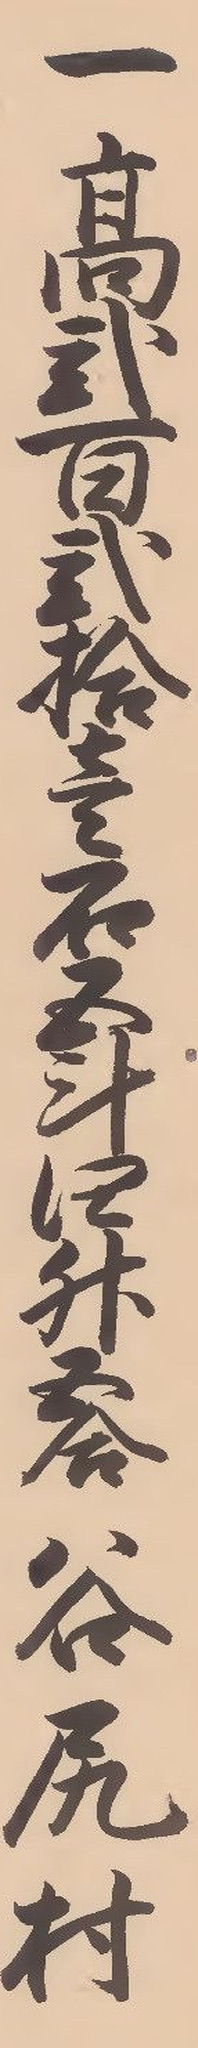一髙弐百弐拾壱石五斗四升五合谷尻村
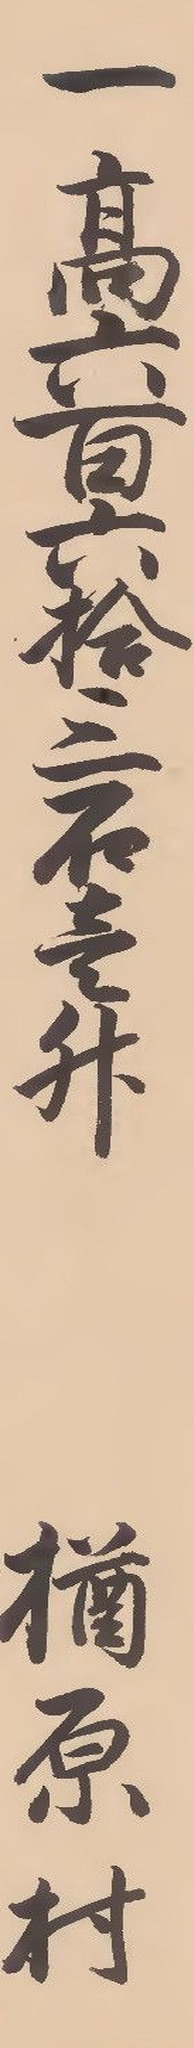一髙六百六拾三石壱升楢原村
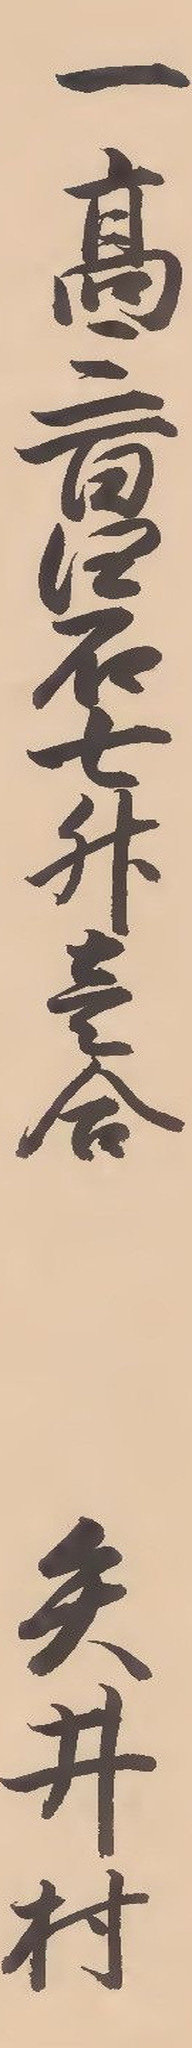一髙三百四石七升壱合矢井村
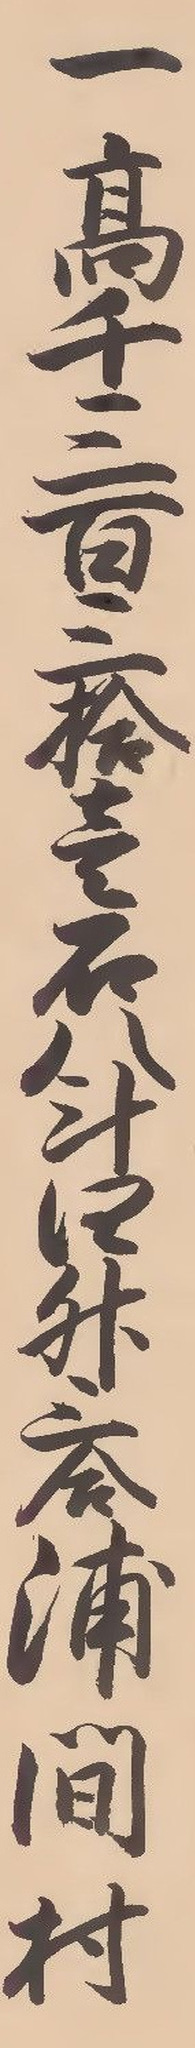一髙千三百三拾壱石八斗四升三合浦間村
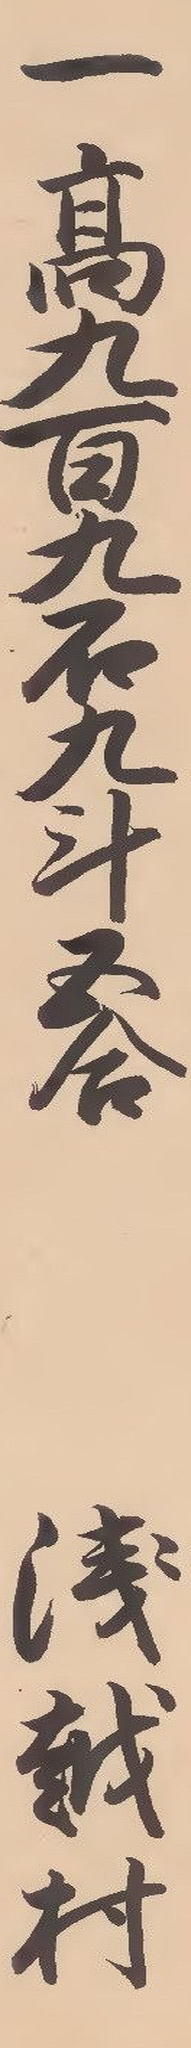一髙九百九石九斗五合浅越村
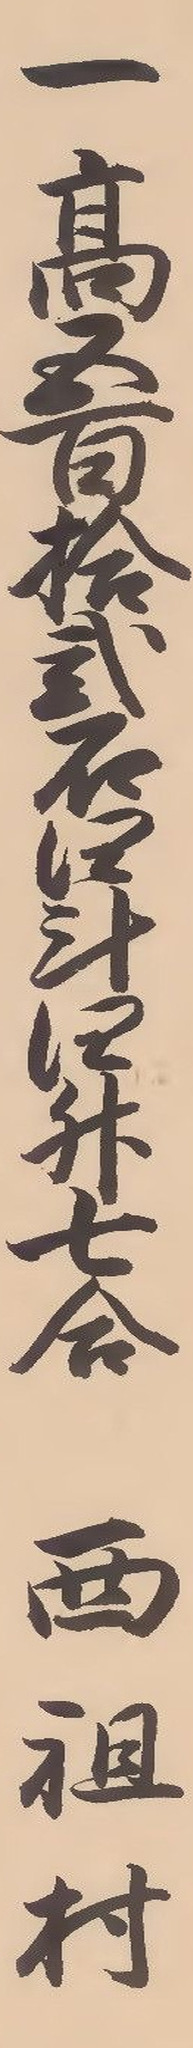一髙五百拾弐石四斗四升七合西祖村
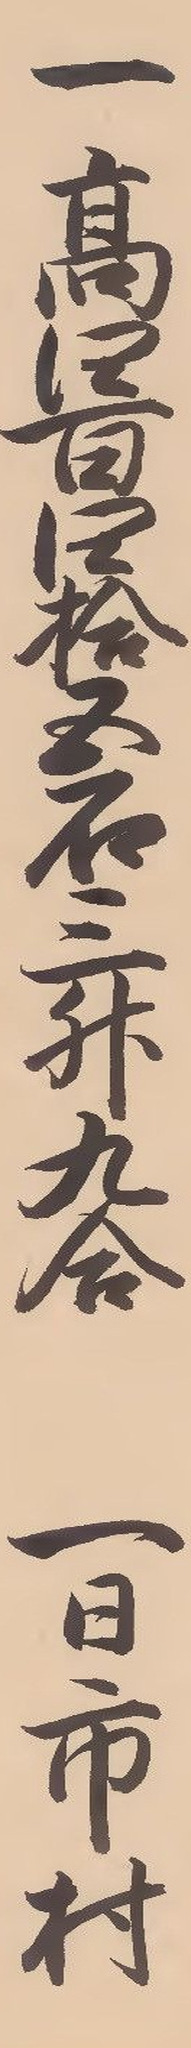一髙四百四拾五石三升九合一日市村
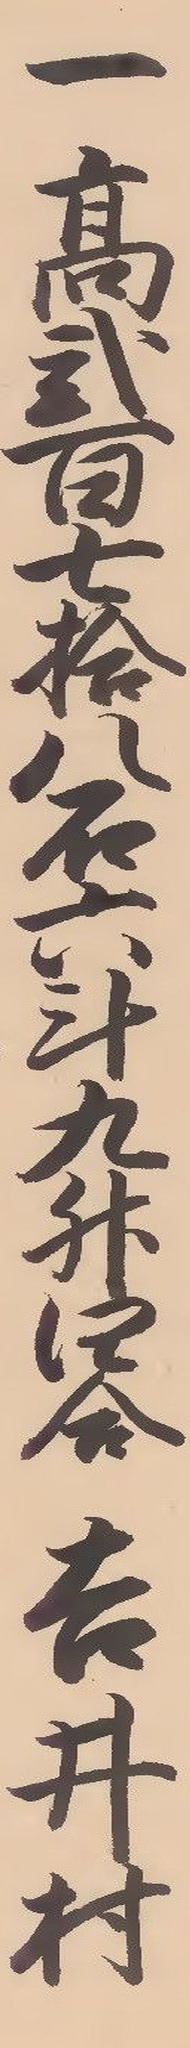一髙弐百七拾八石六斗九升四合吉井村

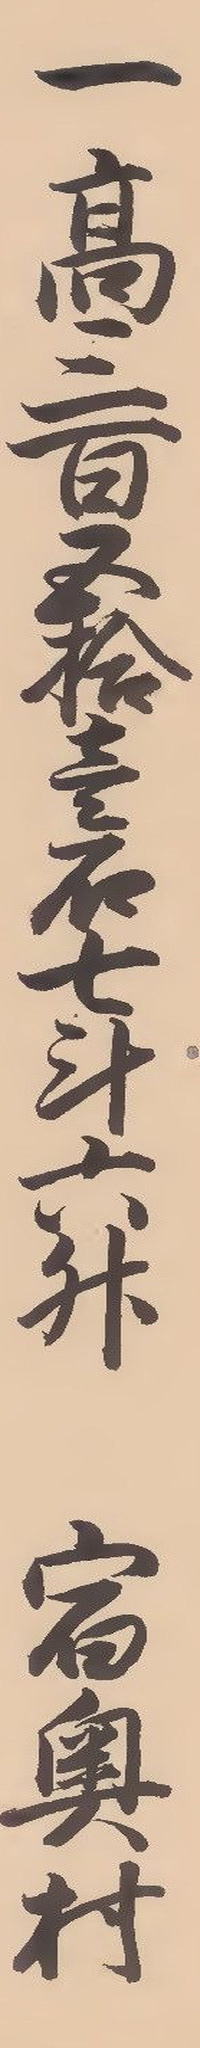一髙三百五拾壱石七斗六升宿奥村
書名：備前国郷帳
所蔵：国立公文書館 National Archives of Japan
